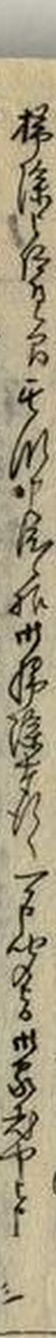掃除被仰付候間其段申渡候様御掃除奉行へ可申聞旨御家老中被申
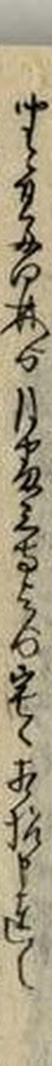聞候に付多田林右衛門月番三寺与右衛門宅へ相招申達之
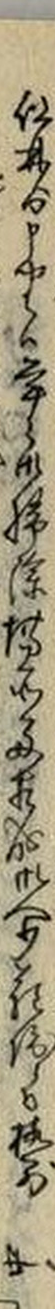但林右衛門申聞候は年々御掃除場所多相成御人少難儀に付格別
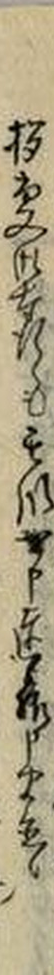拶尚又御奉行へも其段可申達候様申聞置候
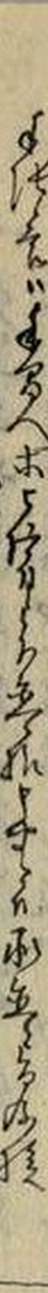手張候節は手間人等被仰付被下置候様申聞候に付承置候旨及挨
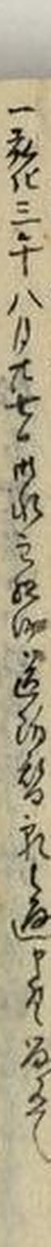一弘化三午八月廿七日御水主組町道附替願之通申付候留有之
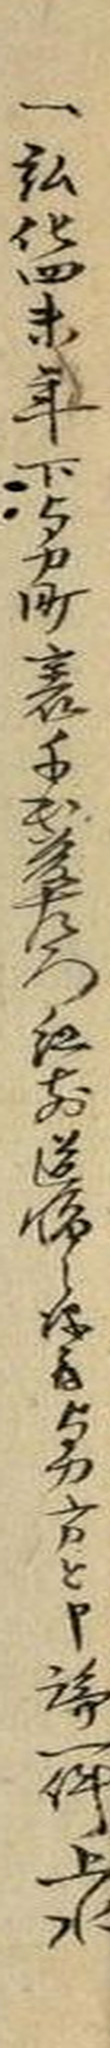一弘化四未年下与力町裏千本藤左衛門組前道幅之儀に付与力方と申論一件上水
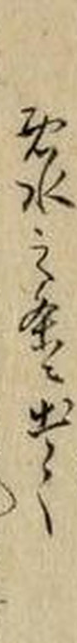悪水之条に出之
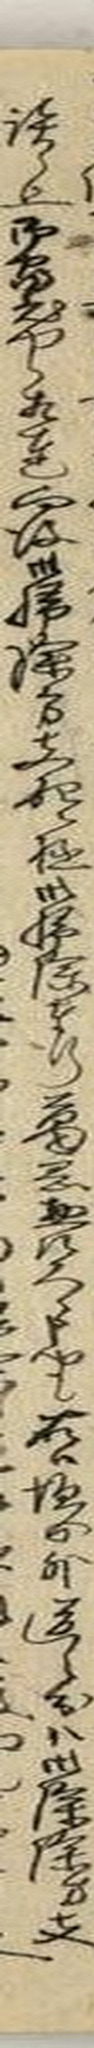談之上御家老中へ相達向後御掃除方支配へ極御掃除奉行葛岡惣左衛門へ申聞候右は垣ゟ外道之分は御掃除方支
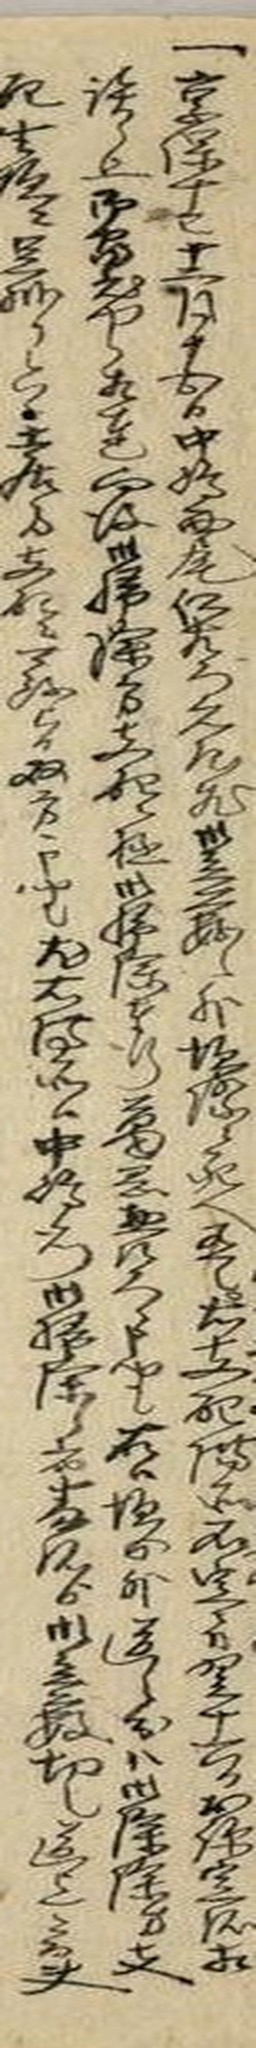配生垣に足掛り候はゝ土居方支配に可致旨双方に申聞候尤右場所は中島御門御掃除之者番所ゟ御立薮切之道迄にて夫
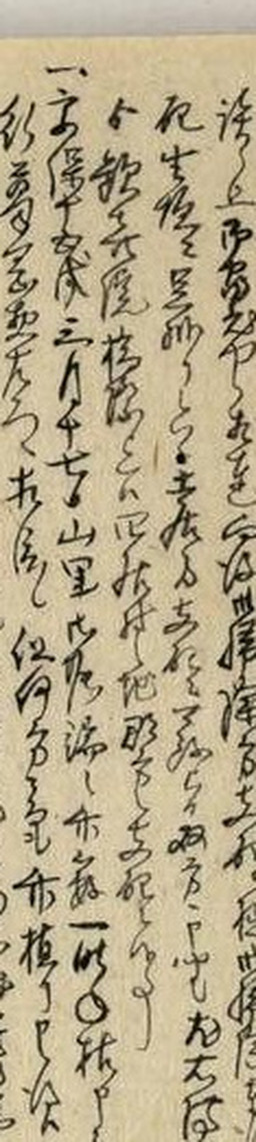ゟ歓喜院橋際迄は四居村之地郡方之支配に候事
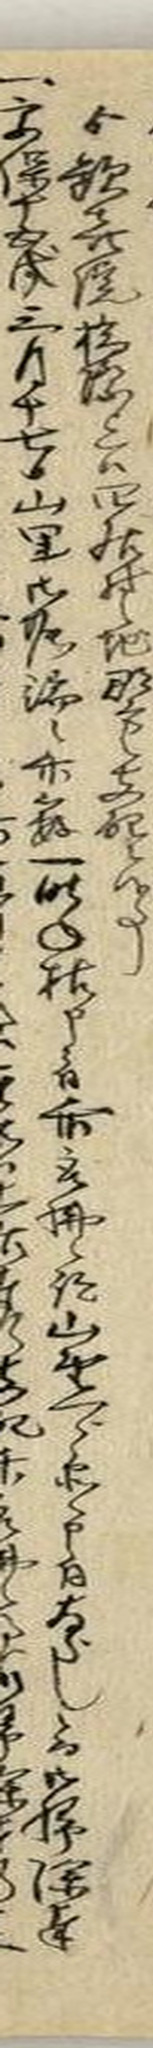一享保十五戌三月十七日山里御堀端之竹薮一昨年枯申に付竹取払候跡山野一郎兵衛へ申付ならし候て御掃除奉
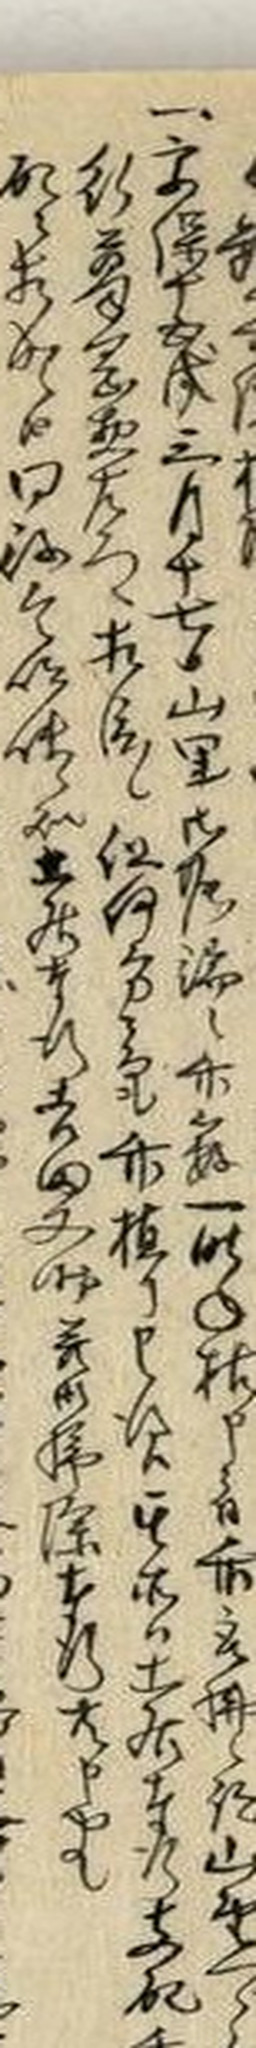配に相成候由同役令吟味候処土居奉行吉田又助并御掃除奉行共申聞候
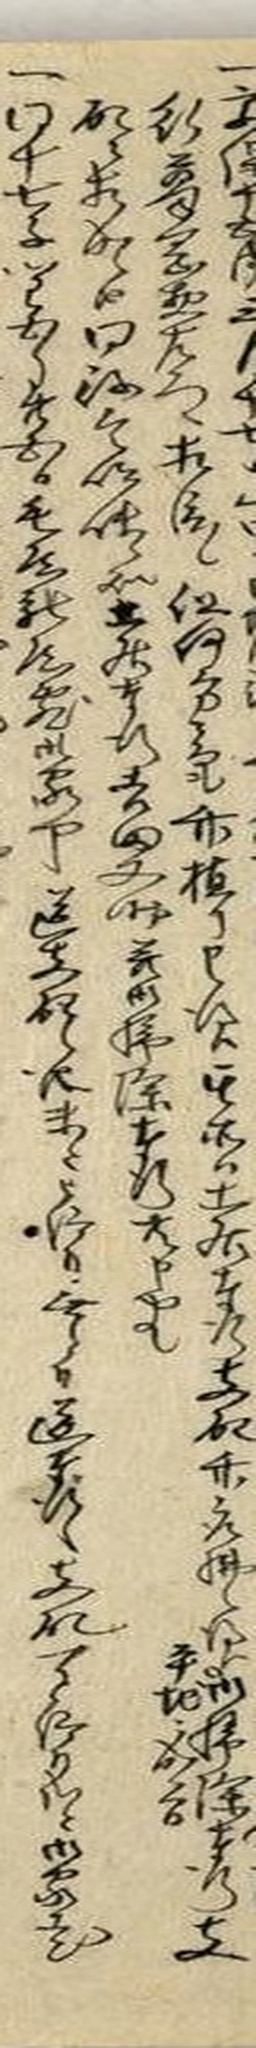一同十七子閏五月廿五日毛屋新屋敷御家中道支配之儀未た被仰付無之に付道奉行へ支配可被仰付哉と御家老
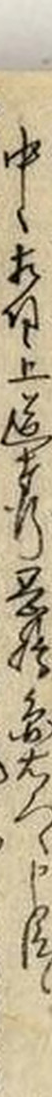中へ相伺候上道奉行岡島円右衛門へ申渡候
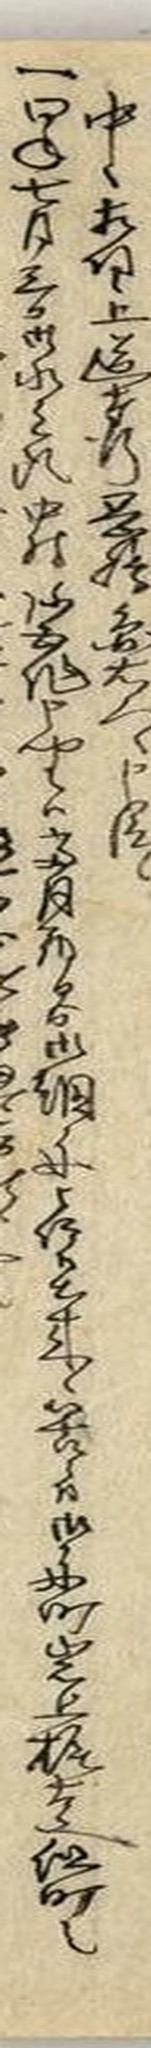一同年七月三日御水主頭中村弥五作申聞候は当月朔日ゟ御網舟被仰付出来候筈に付御舟町岩上梶大夫組町之
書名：御城下諸事之部
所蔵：福井県文書館 Fukui Prefectural Archives
